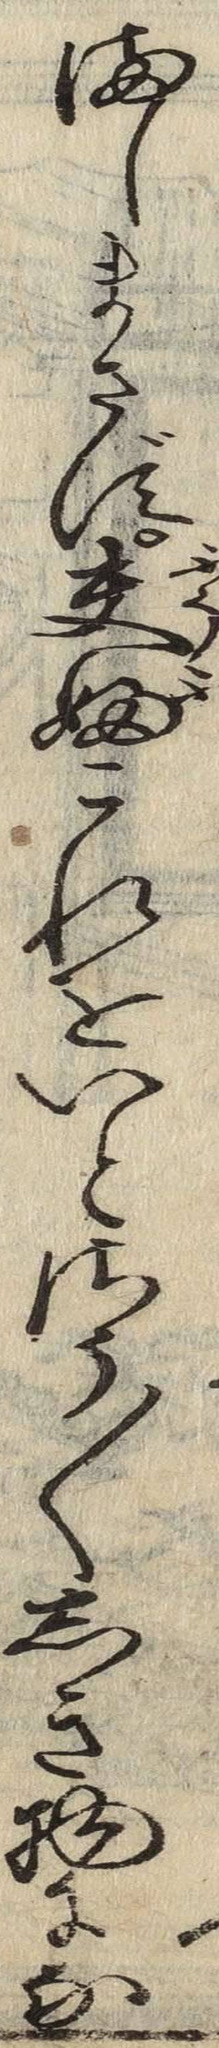ましまさず。夫婦これをいとさう〳〵しき物にな
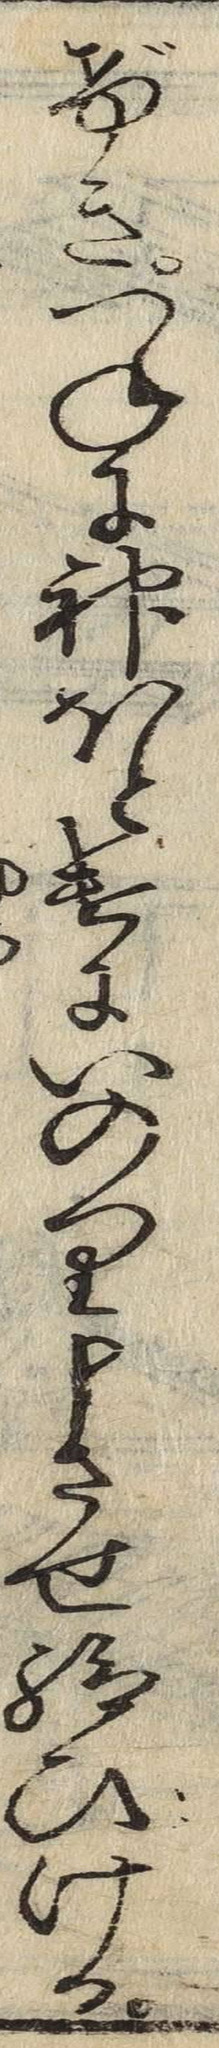げき。つねに神ほとけにいのり申させ給ひける。
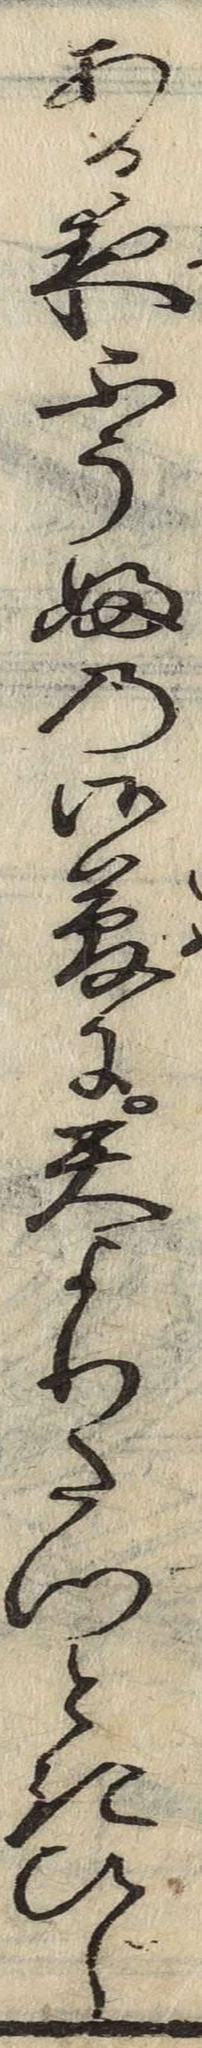ある夜ふうふの御夢に。天よりたつときひし
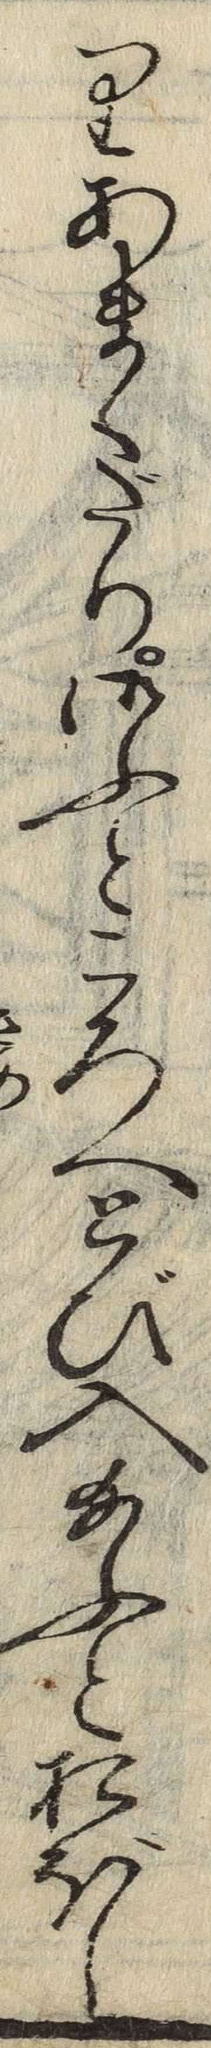りあまくだり。御ふところへとび入給ふとおぼし
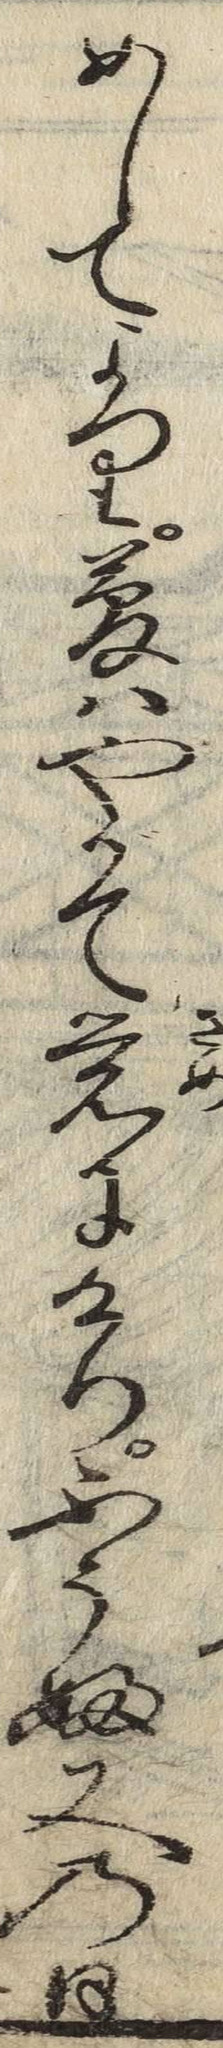めしてより。夢はやかて覚にけり。ふうふ又の日
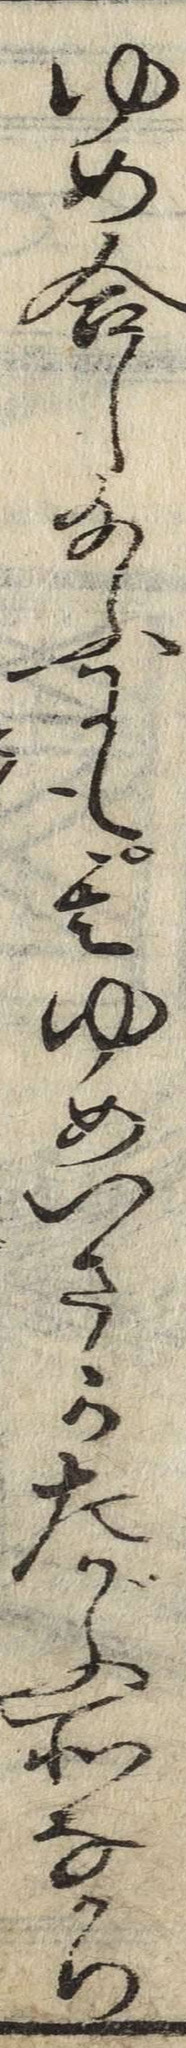ゆめ合し給ふにも。其ゆめいさゝかたがふ所なかり
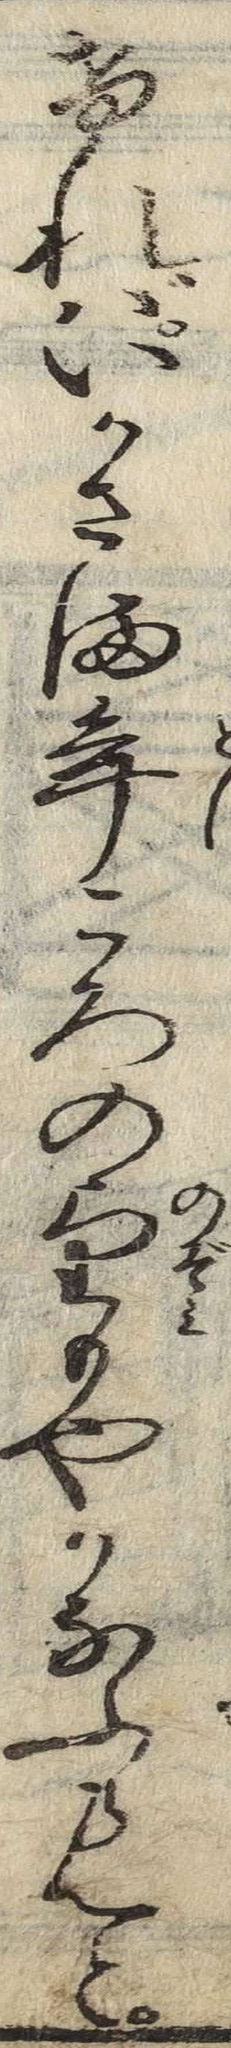ければ。いかさま年ころの望もやかなふらんと。
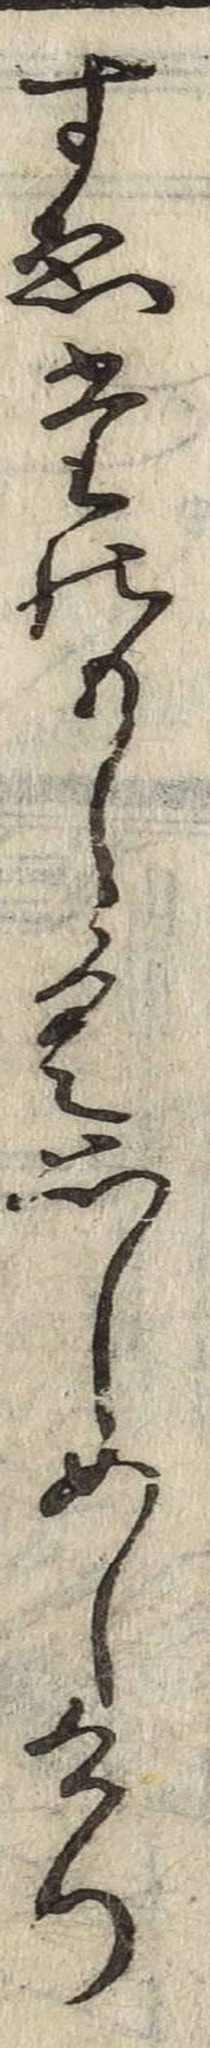すゑたのもしく思しめしけり

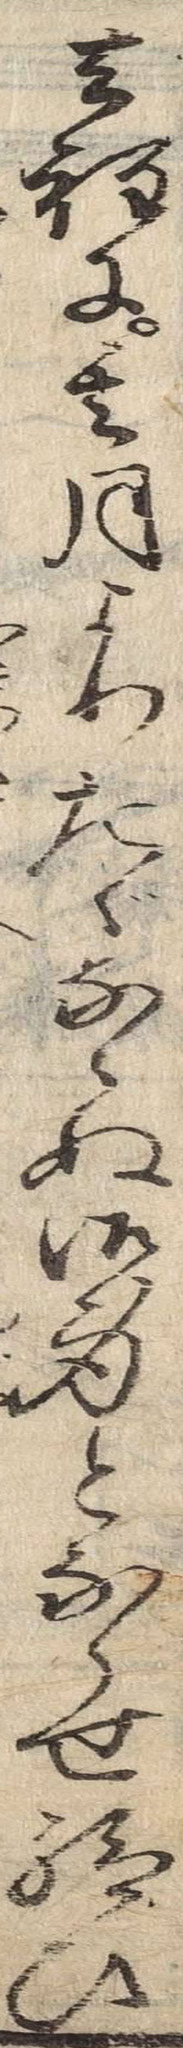去程に。其月より只ならぬ御身とならせ給ひ
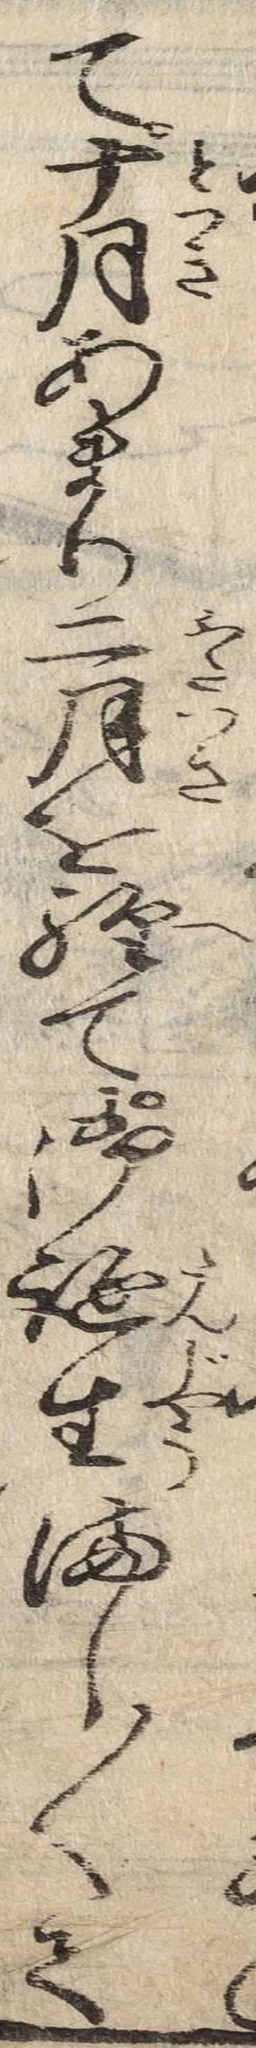て。十月あまり二月を経て。誕生まし〳〵て
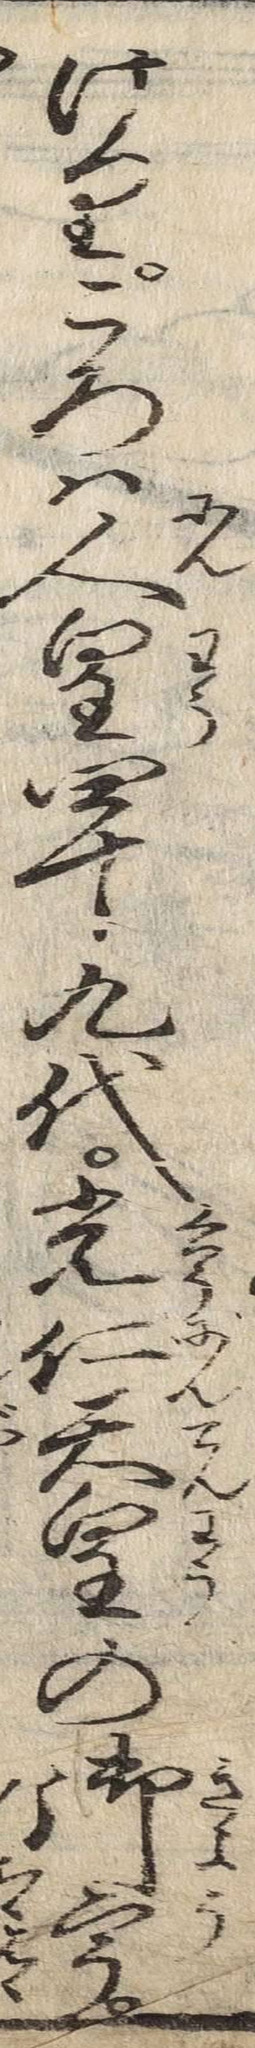けり。ころは人皇四十九代。光仁天皇の御宇
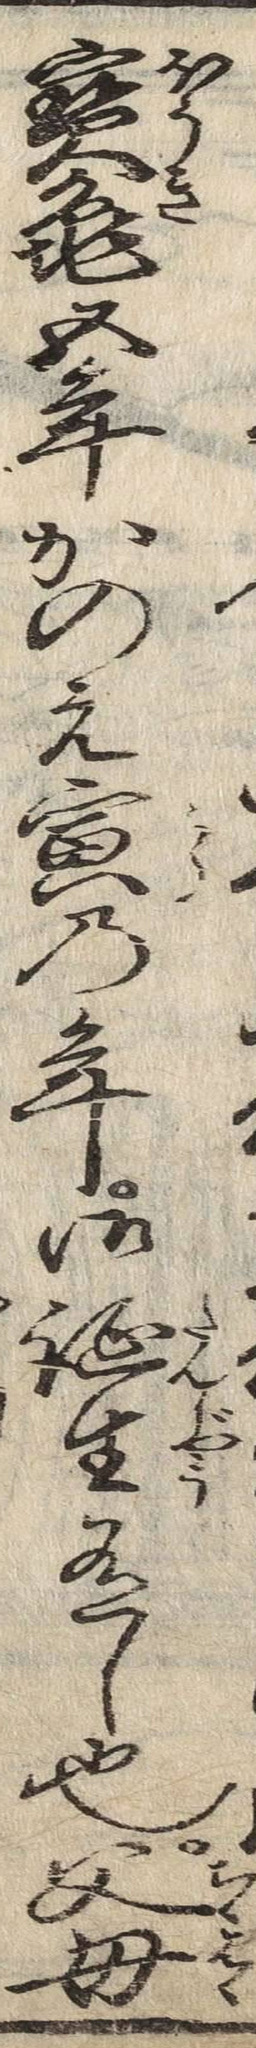宝亀五年かのえ寅の年。御誕生有し也。父母
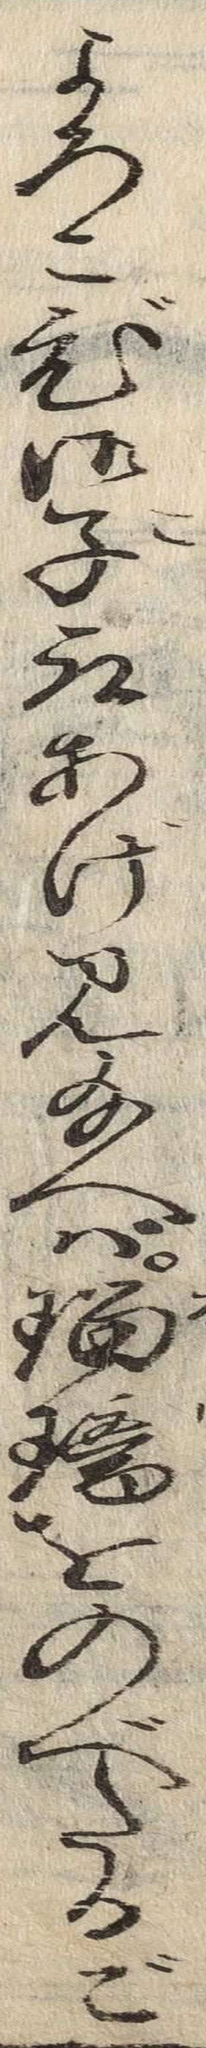よろこび御子取あげ見給へば。瑠璃をのべたるご
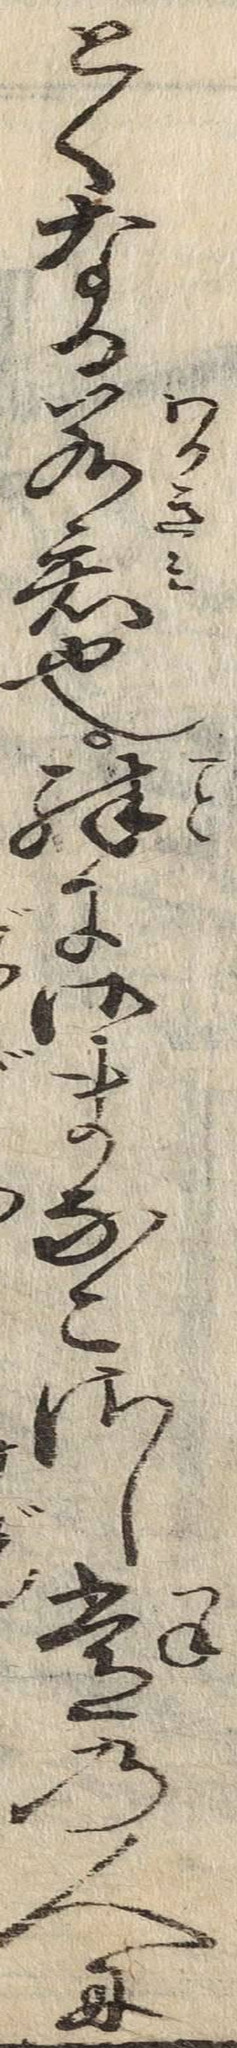とくなる若君也。殊に御まなこさし常の人に
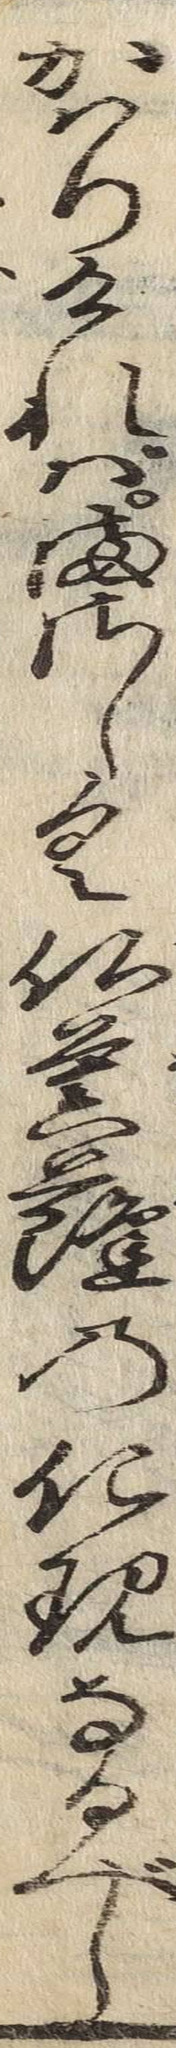かはりければ。まさしく仏菩薩の化現なるべし
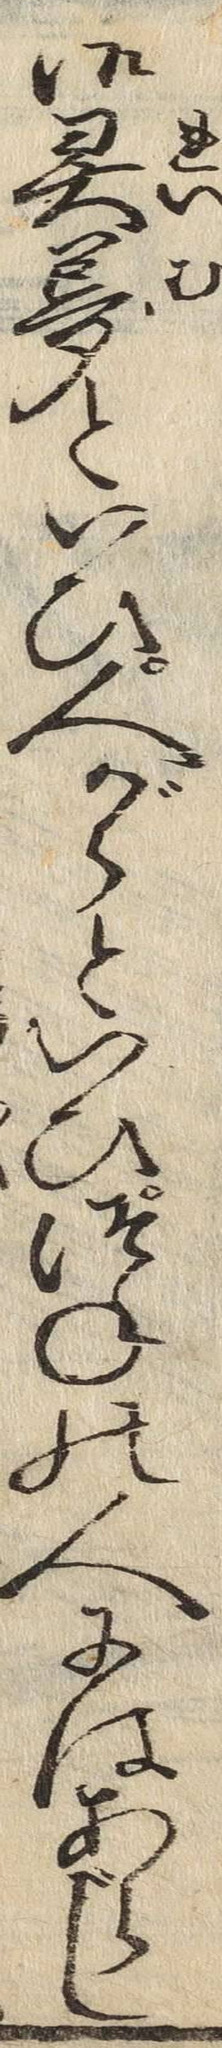御霊夢といひ。人がらといひ。つねの人にはあらじ
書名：弘法大師御傳記
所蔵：京都府立京都学・歴彩館 国文学研究資料館
